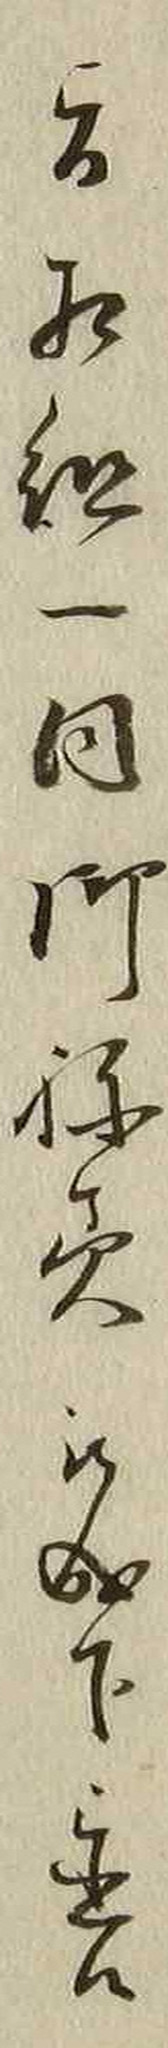旨相組一同御称美被成下置候
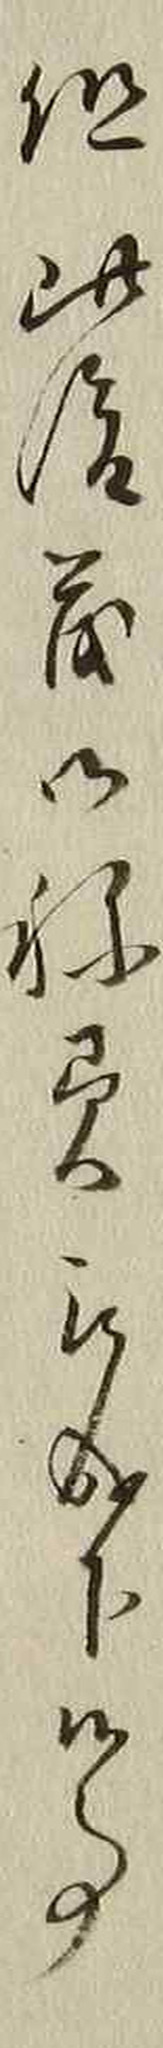但此後茂御称美被成下候事
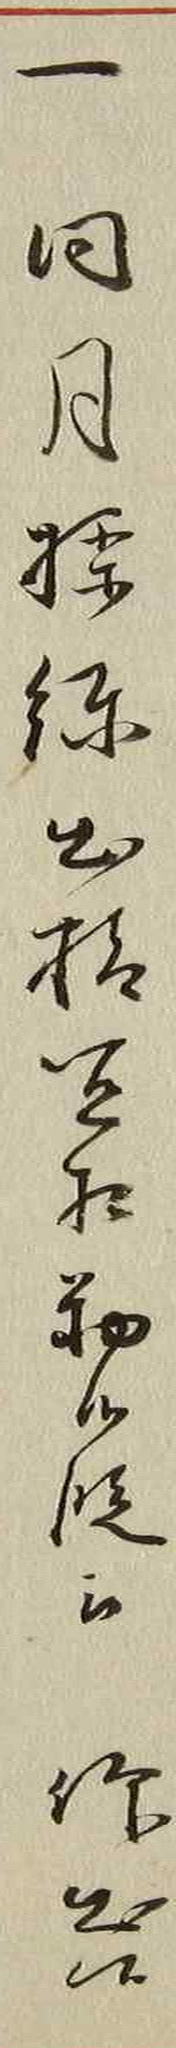一同月操練出精宜相勤候段被仰出候
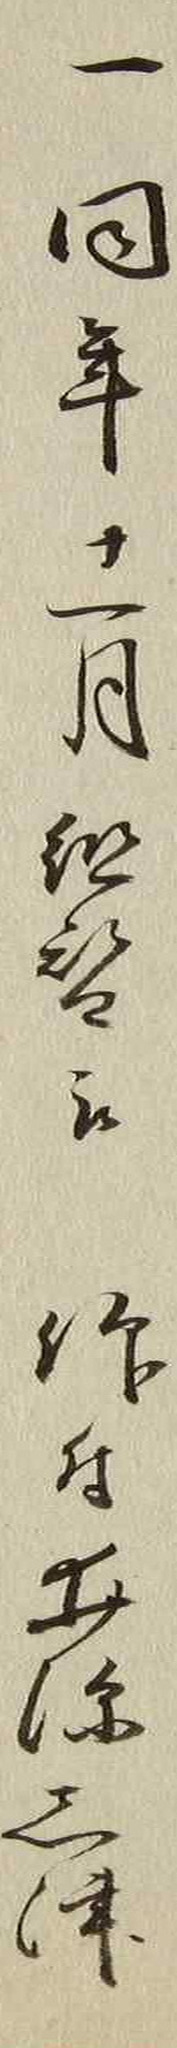一同年十一月組替被仰付井深志津
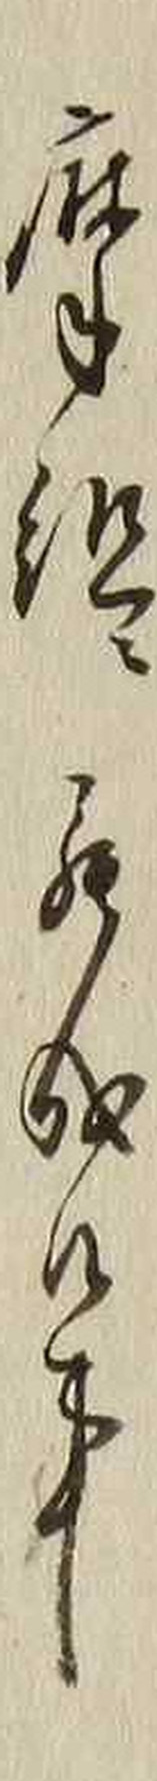摩組ニ罷成候事
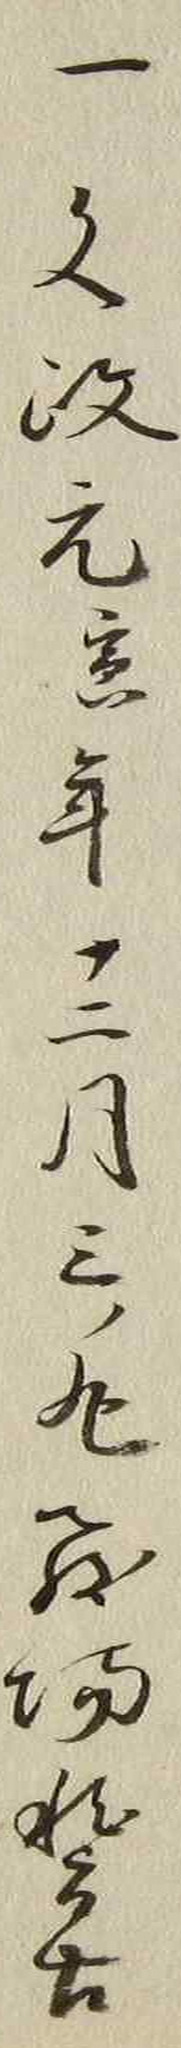一文政元寅年十二月三ノ丸教場稽古
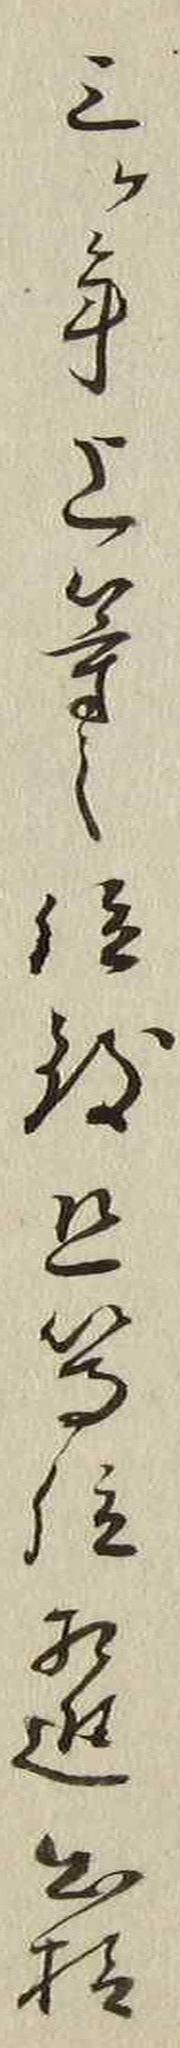三ケ年上等之位致旦等位相進出精
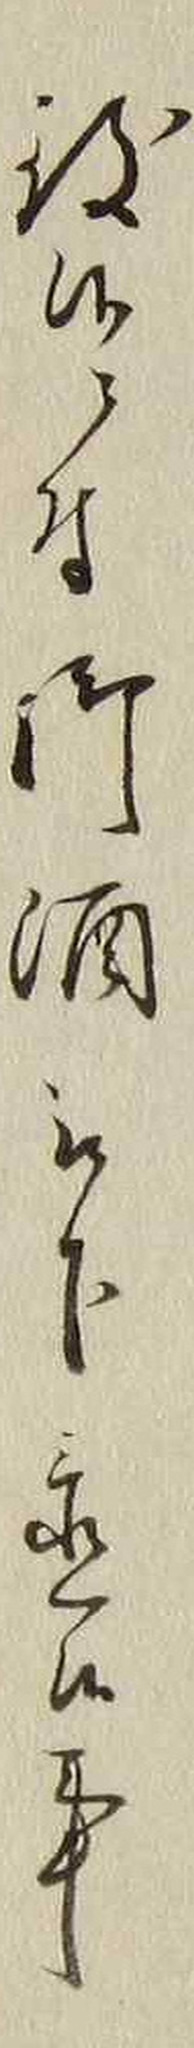致候ニ付御酒被下置候事
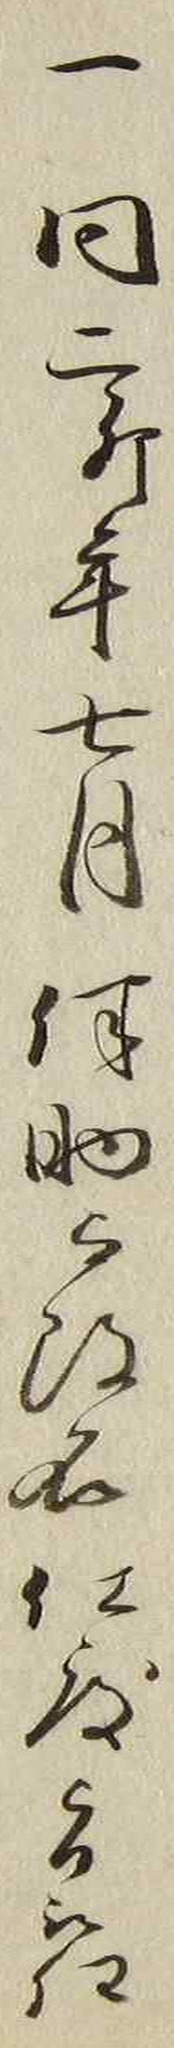一同二卯年七月伴助与改名仕度旨被任
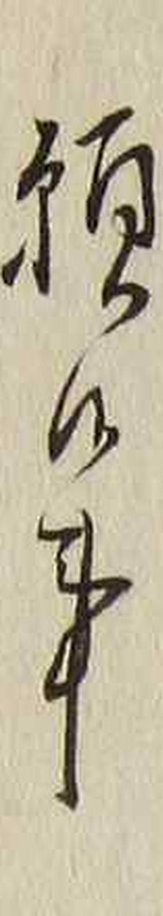願候事
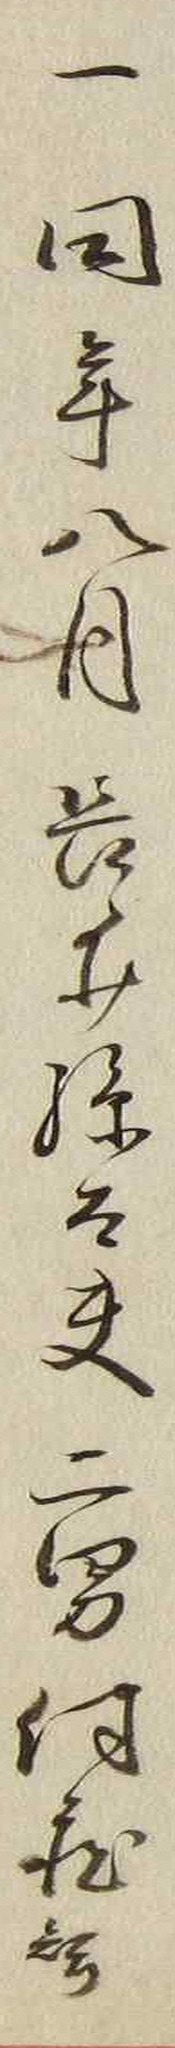一同年八月長井孫太夫二男何蔵聟
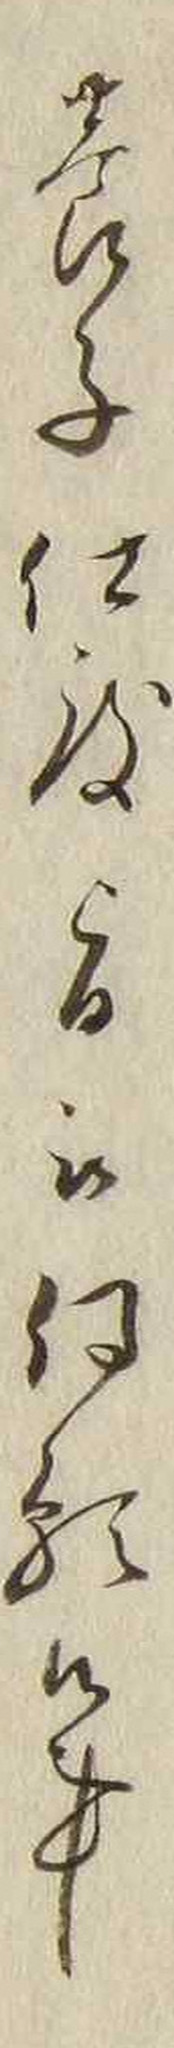養子仕度旨被任願候事

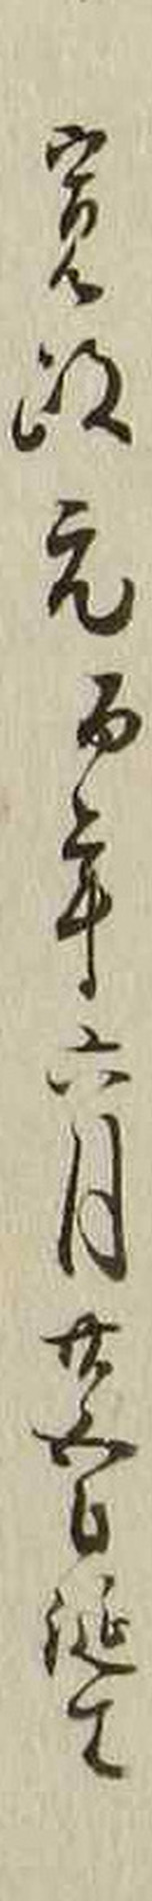寛政元酉年六月廿五日誕生
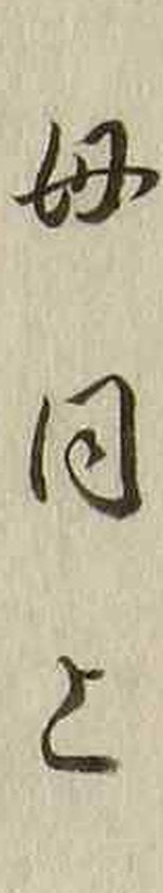母同上
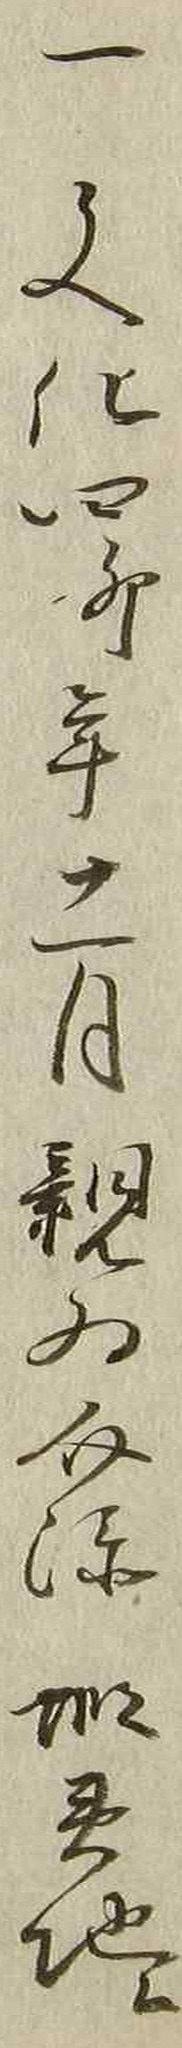一文化四卯年十一月親為介添蝦夷地江
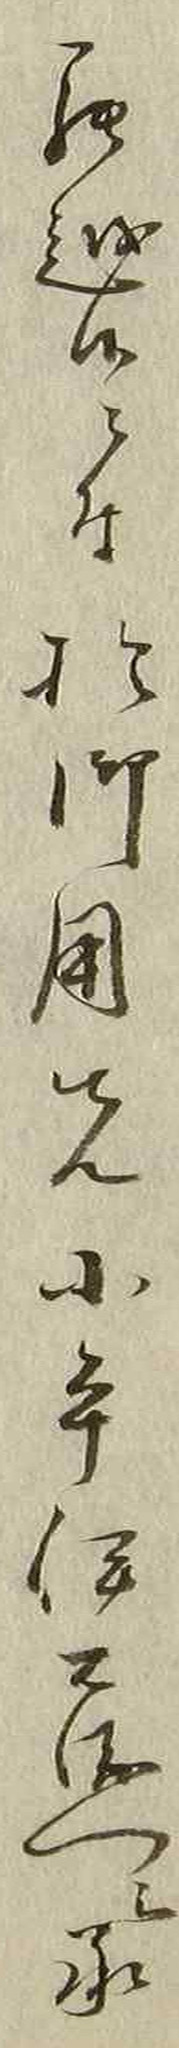罷越候ニ付於御用先小平伊右衛門江承
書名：諸士系譜　巻之25　い之部25
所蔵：会津若松市立会津図書館
